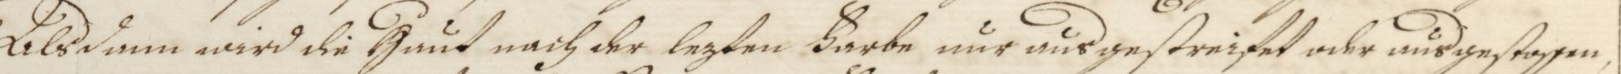Als dann wird die Haut nach der lezten Farbe nur ausgestreifet oder ausgestossen,
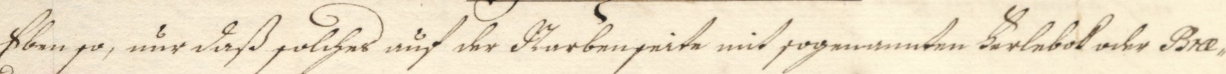Eben so, nur daß solches auf der Narbenseite mit sogenannten Ferlebok oder Bra-
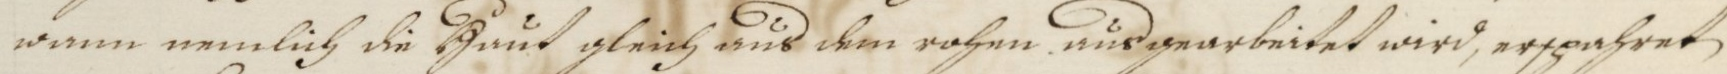wann nemlich die Haut gleich aus dem rohen ausgearbeitet wird, erspahret
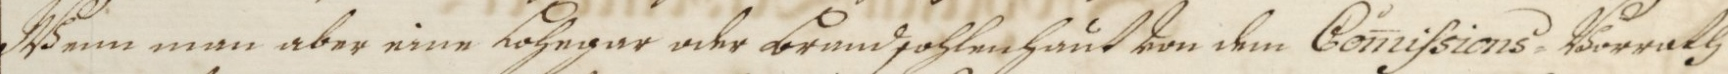Wenn man aber eine Lohegar oder Brandsohlenhaut von dem Commissions-Vorrath
